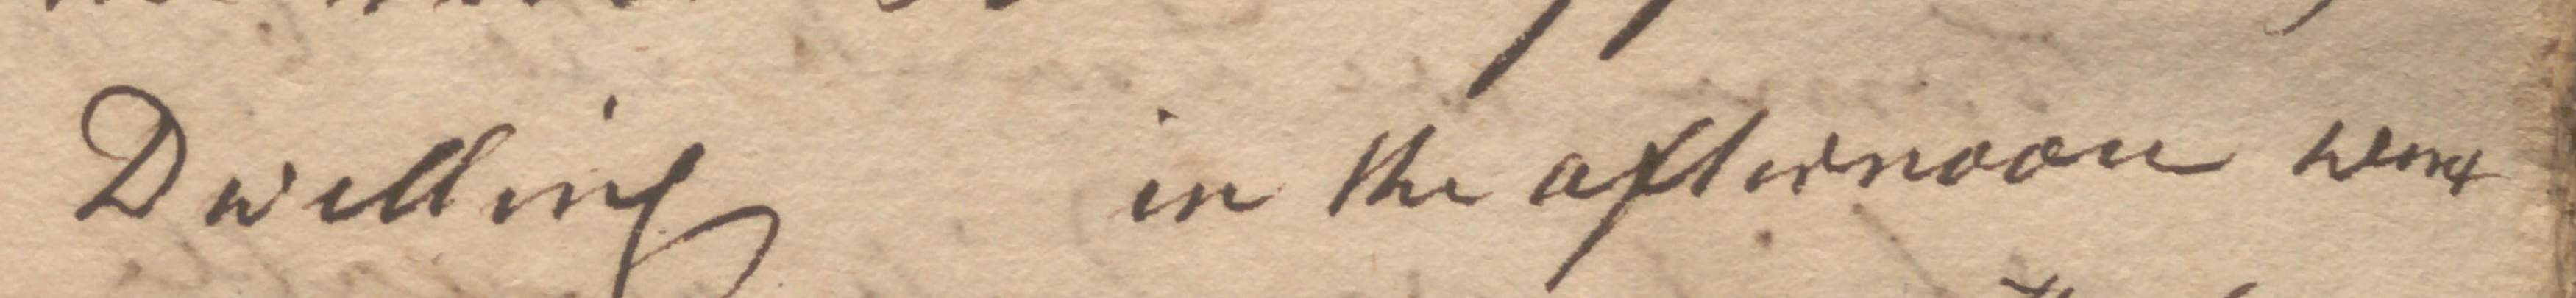Dwelling in the afternoon went
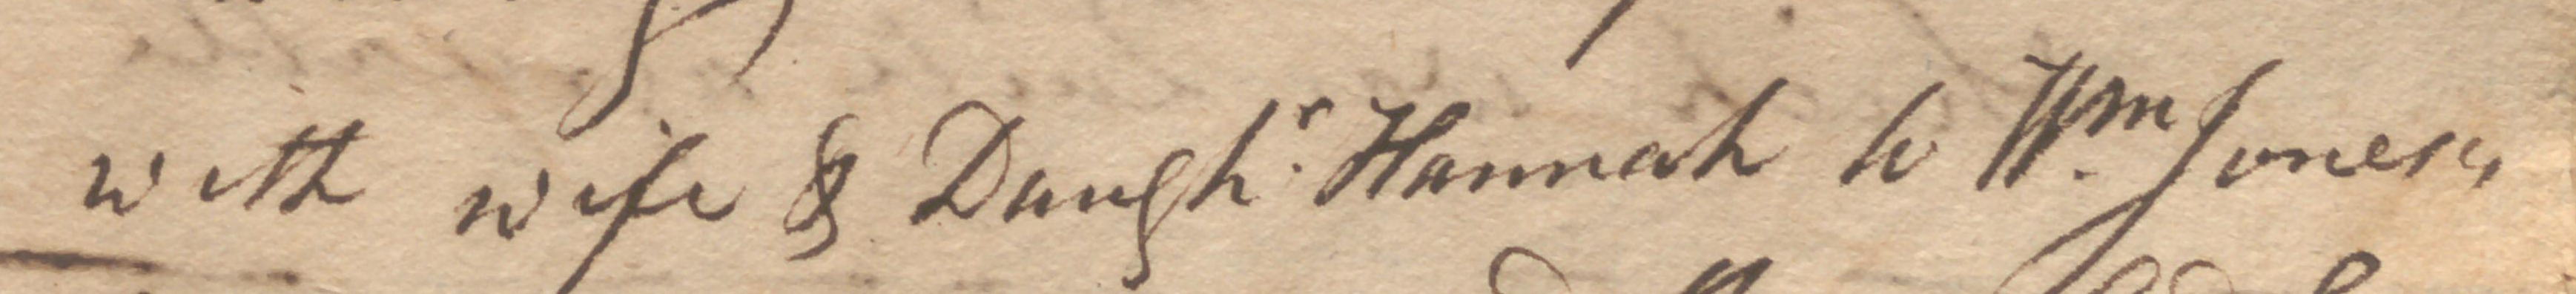with wife & Daugh^r. Hannah to W^m. Joneses
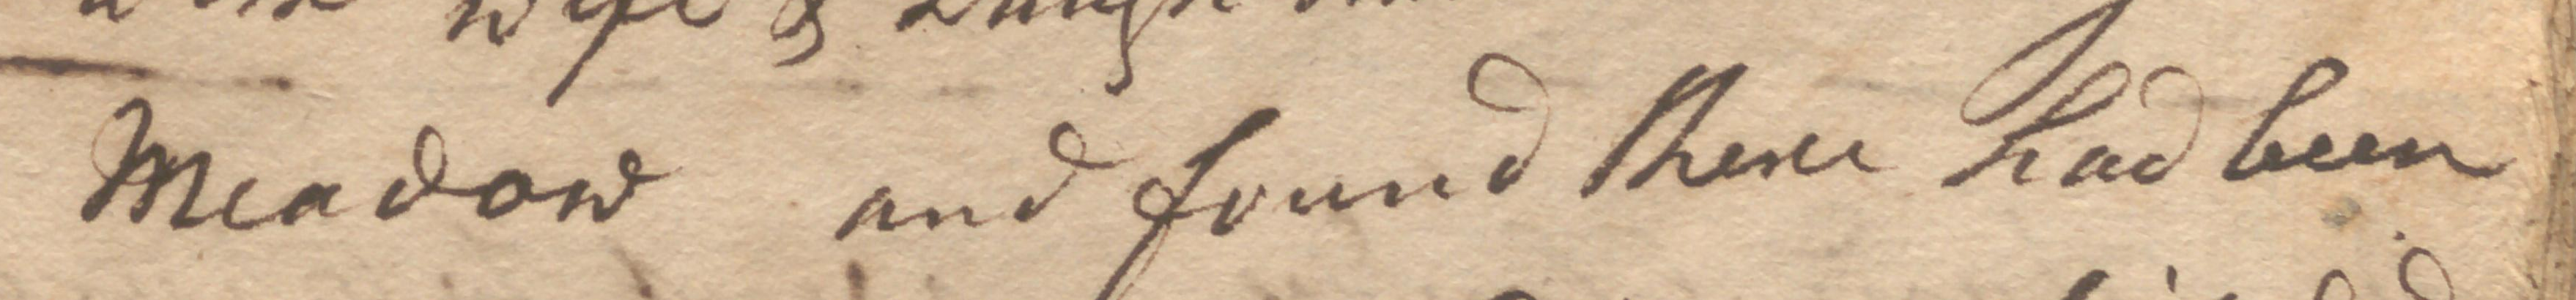Meadow, and found there had been
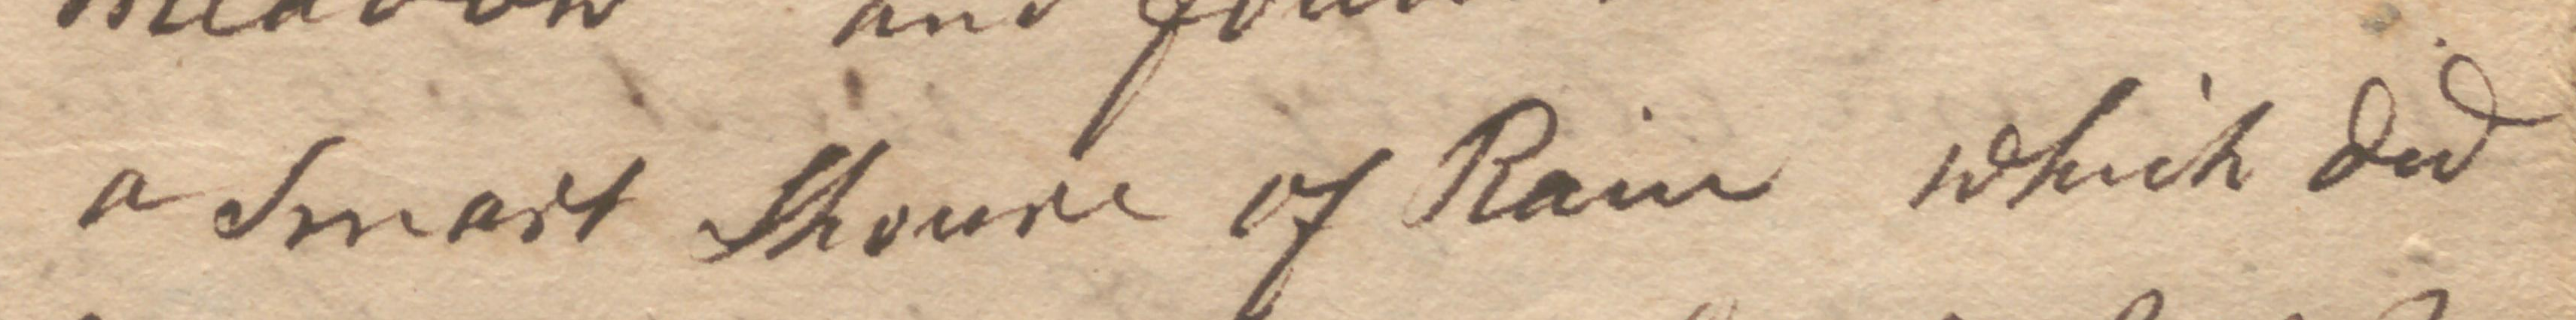a smart Shoure of Rain which did
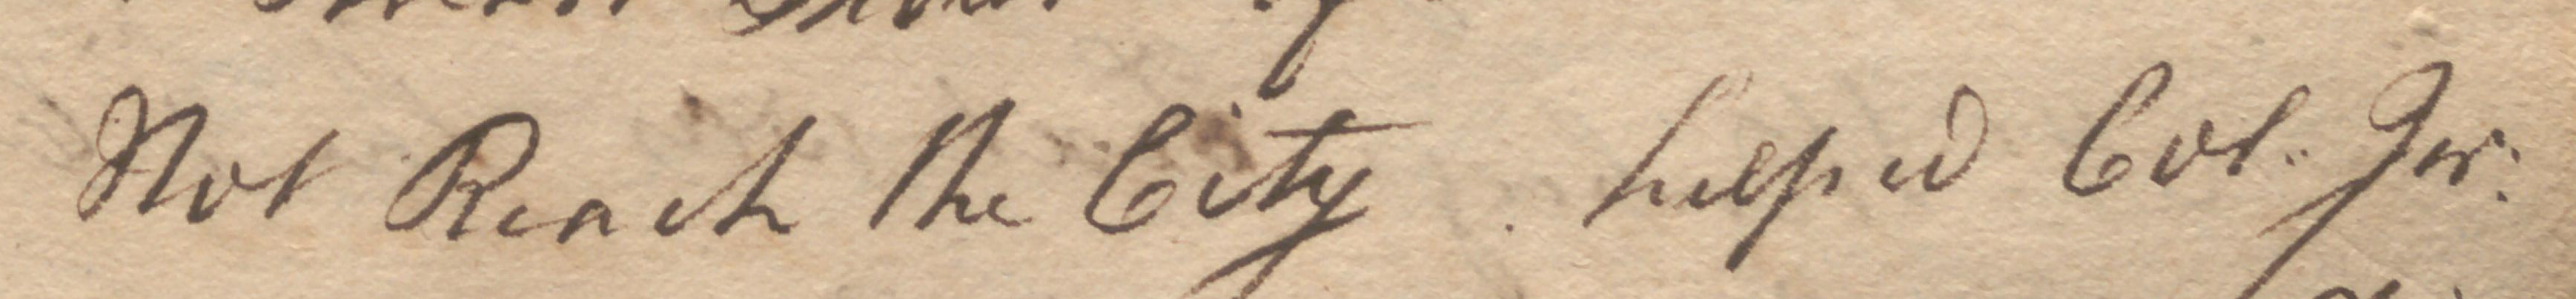Not Reach the City, helped Col: Jer:
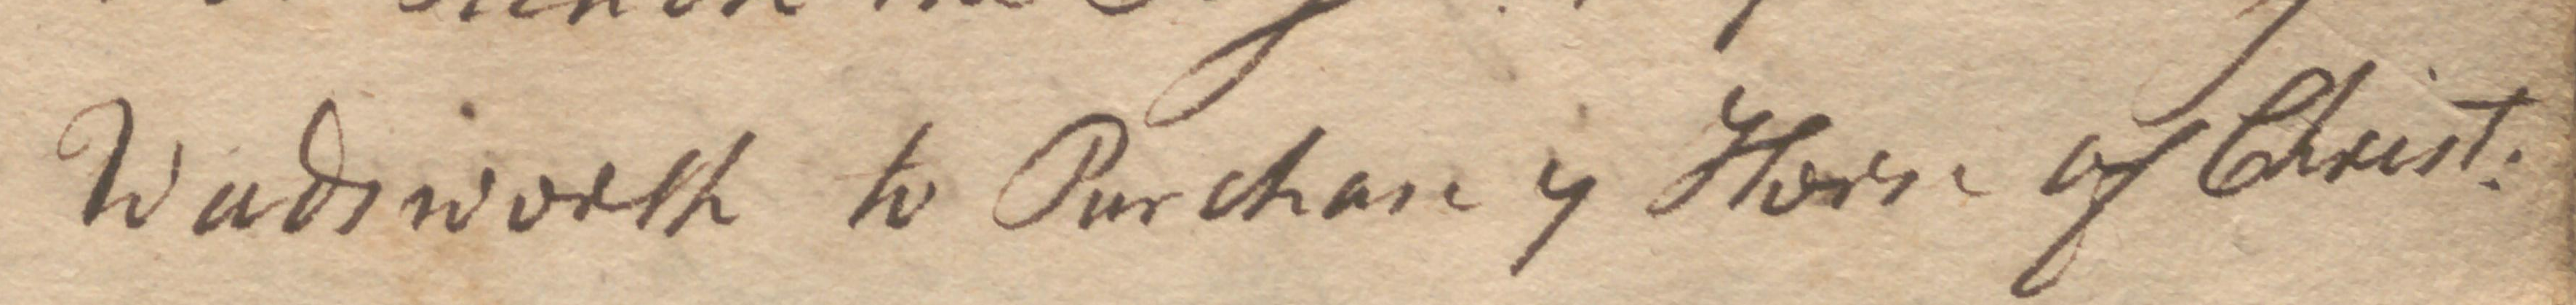Wadsworth to Purchase 7 Horse of Christ:
